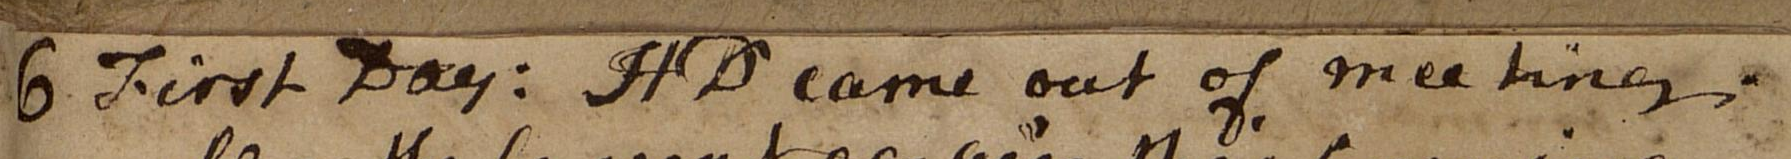6 First Day: HD came out of meeting
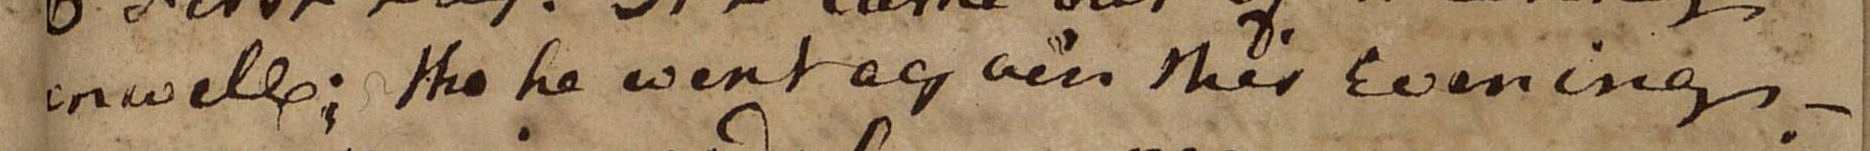inwell; the he went again this Evening-
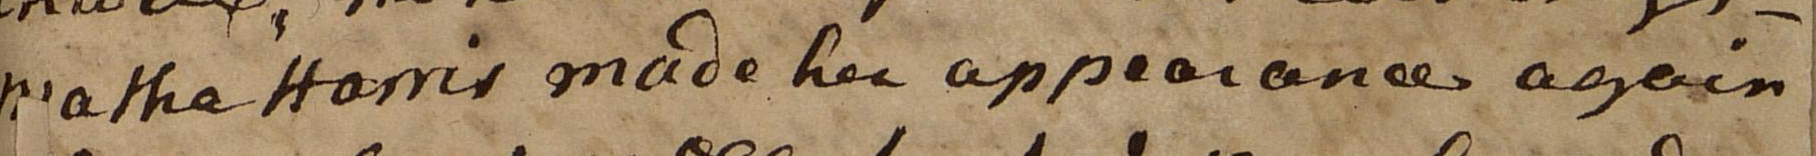Matha Harris made her appearance again
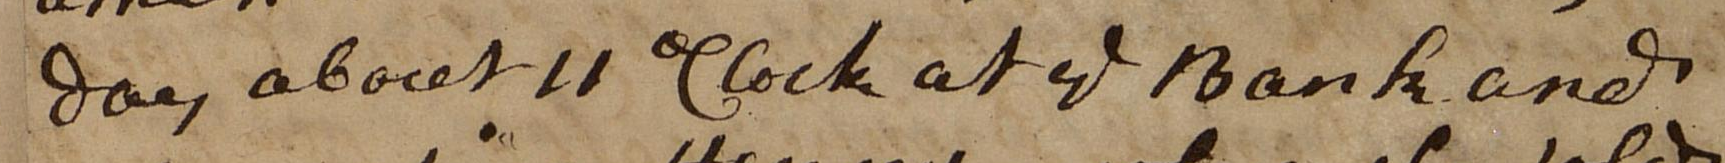day about 11 ^o Clock at y^e Bank and
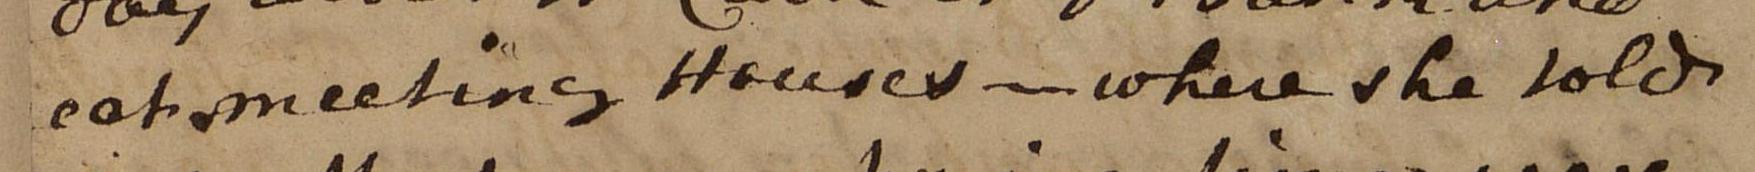eat meeting Houses- where she told
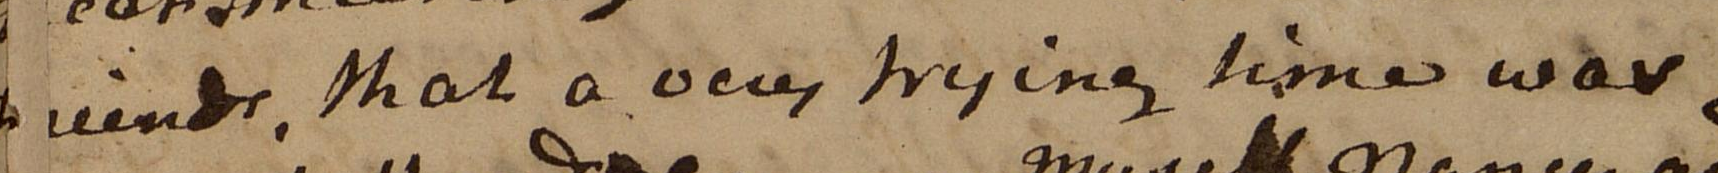reinds, that a very trying time was
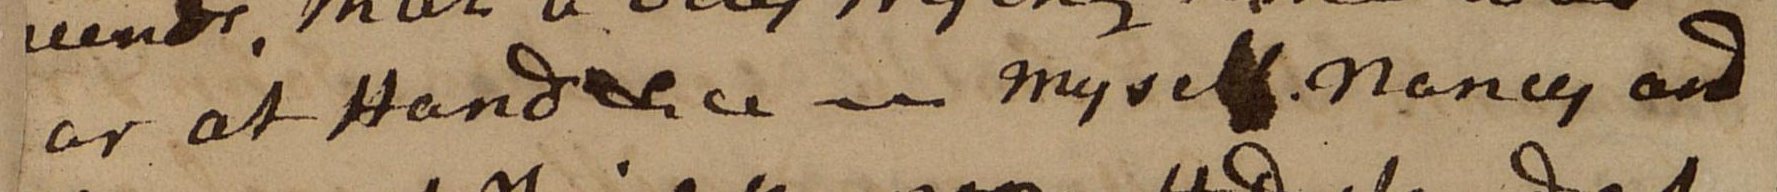a[s] at Hand &c- my self Nancy and
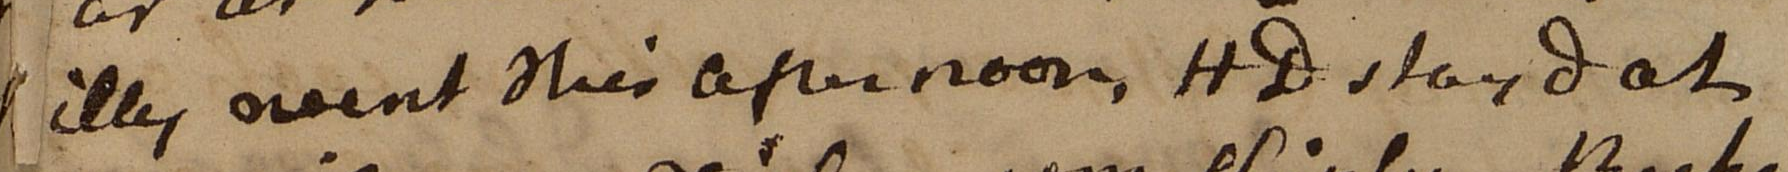illy went this afternoon, HD stayd at
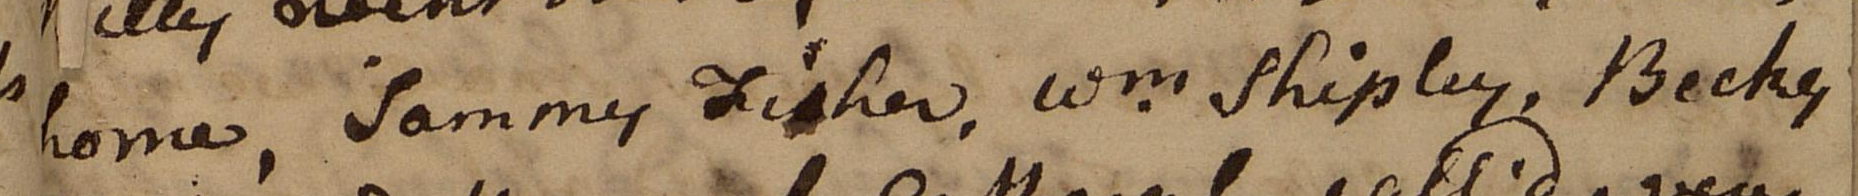home, Sammy Fisher, W^m. Shipley, Becky
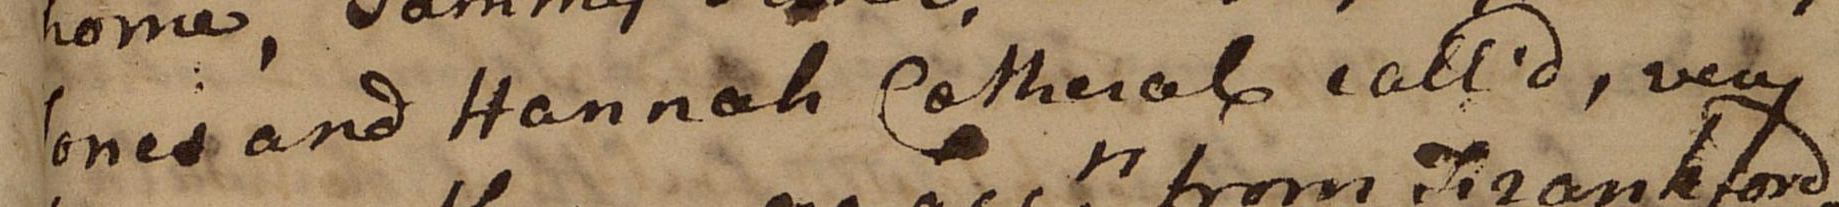Jones and Hannah Catheral call'd, very
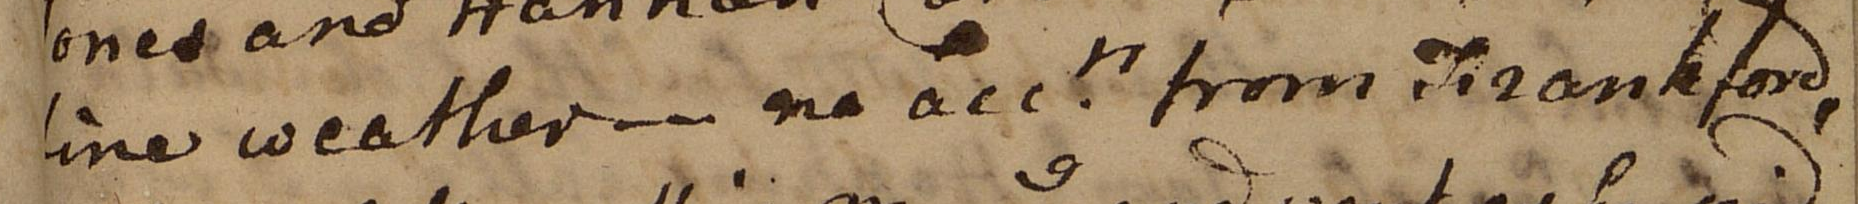fine weather- no acc^t. from Frankford,
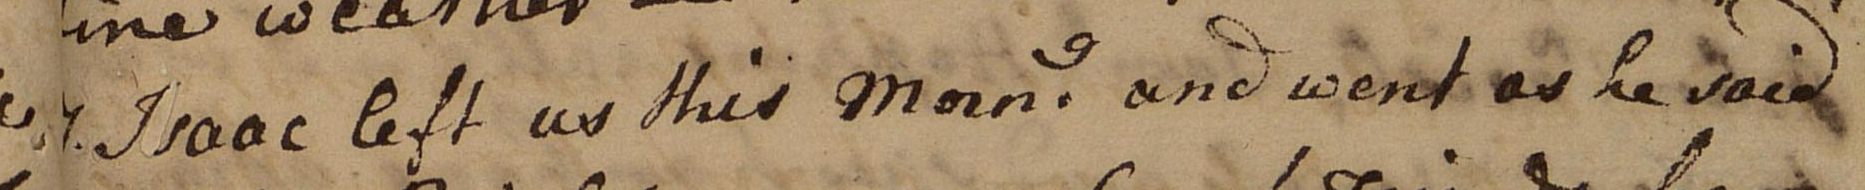Isaac left us this Morn.^g and went as he said
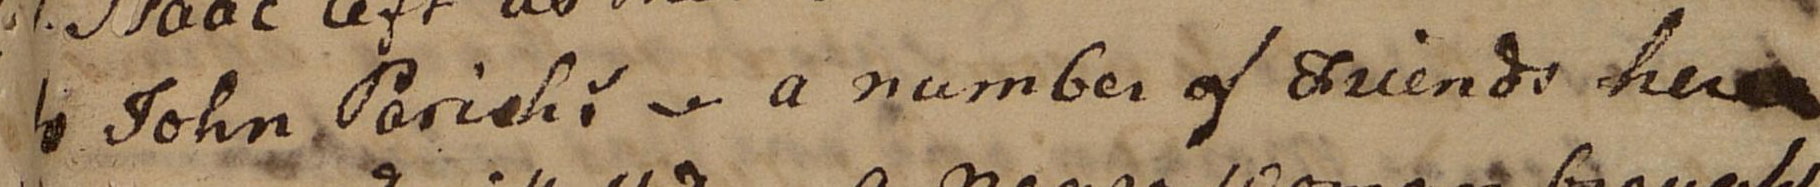to John Parish^s.- a number of Friends here
